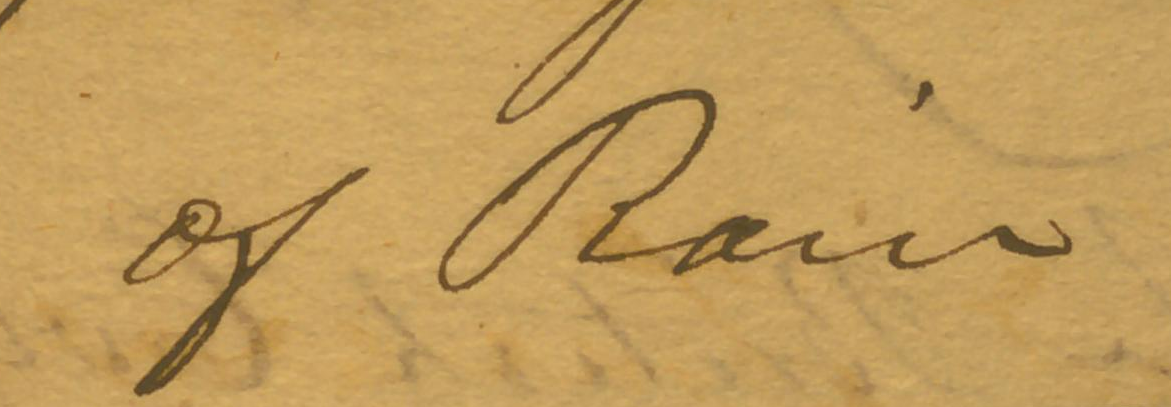of Rain
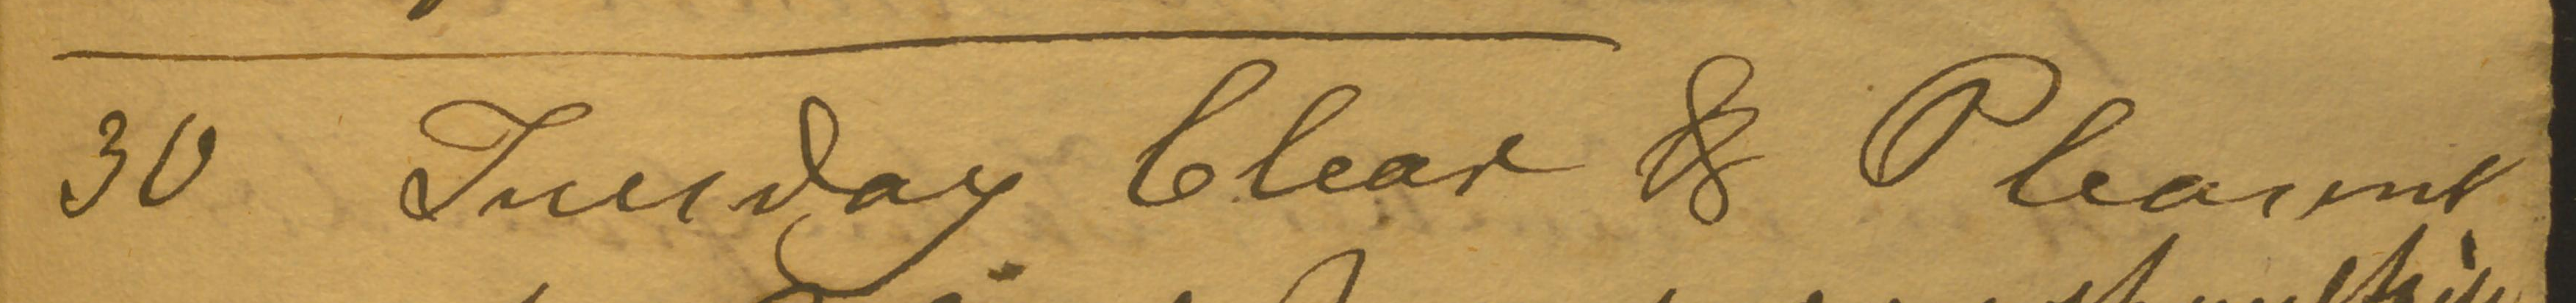30 Tuesday Clear & Pleasent
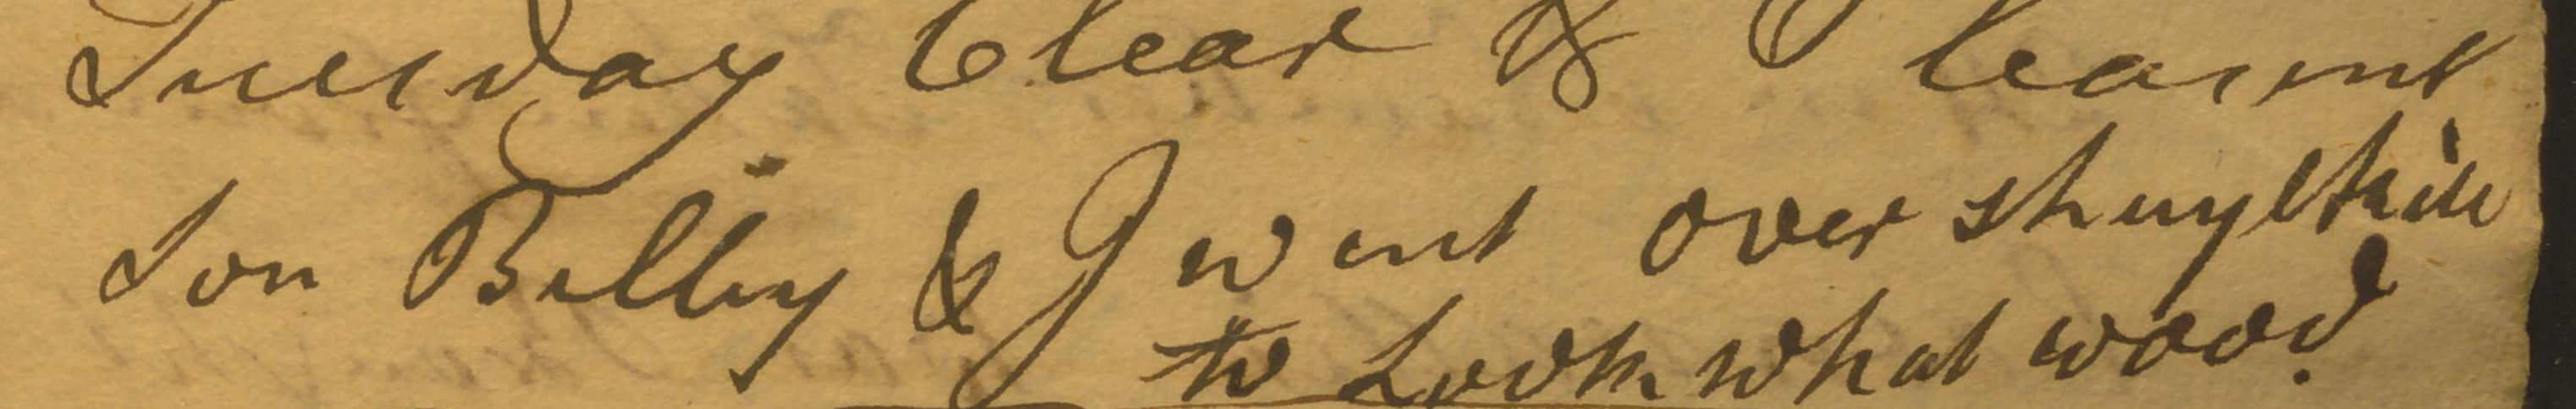Son Billey & I went over shuylkill
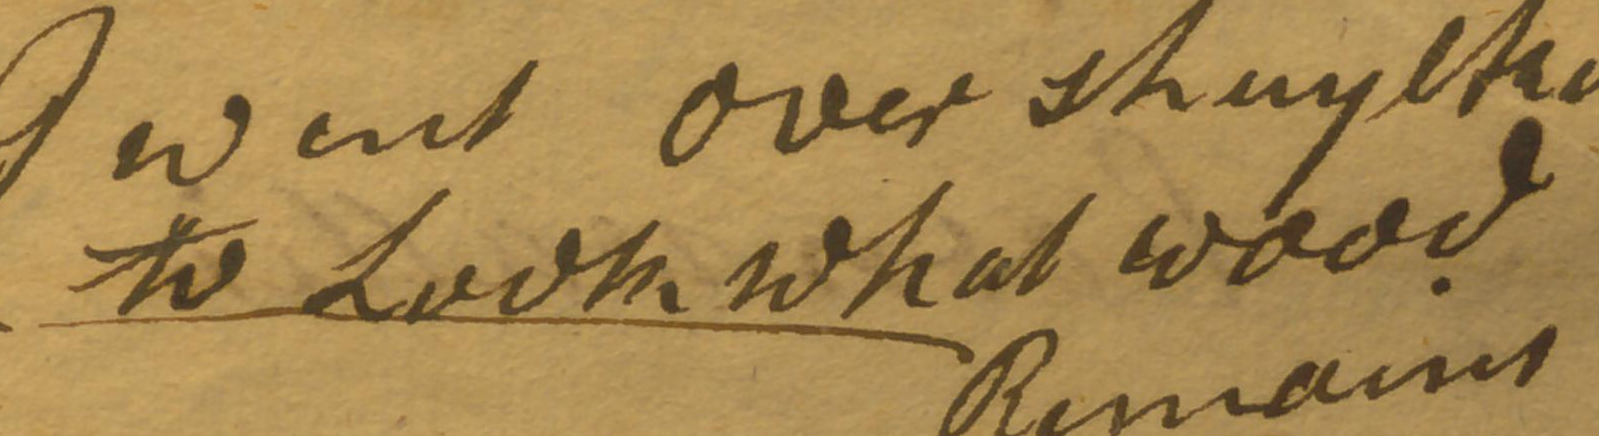to Look what wood
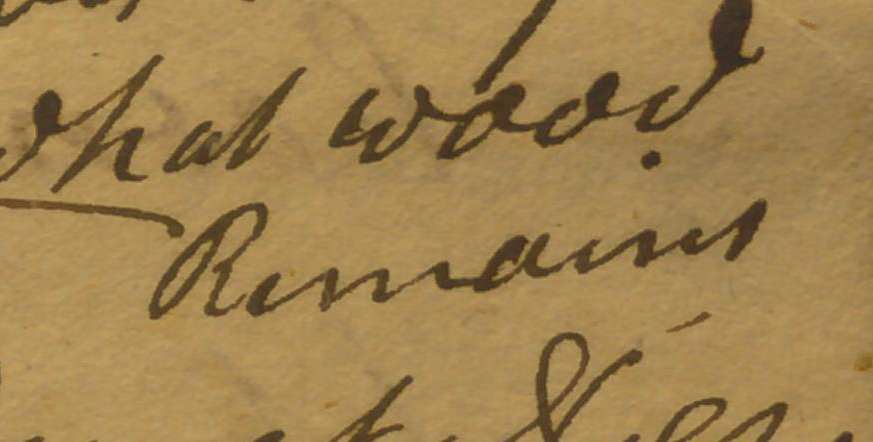Remains
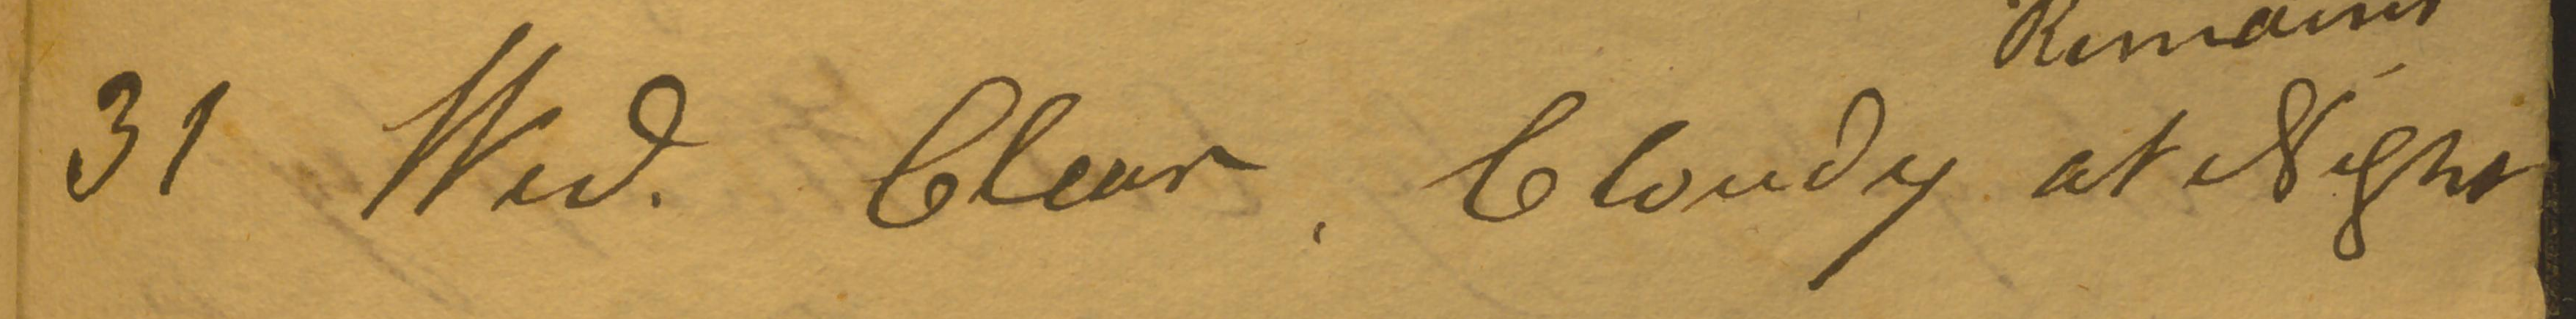31 Wed. Clear Cloudy at Neght
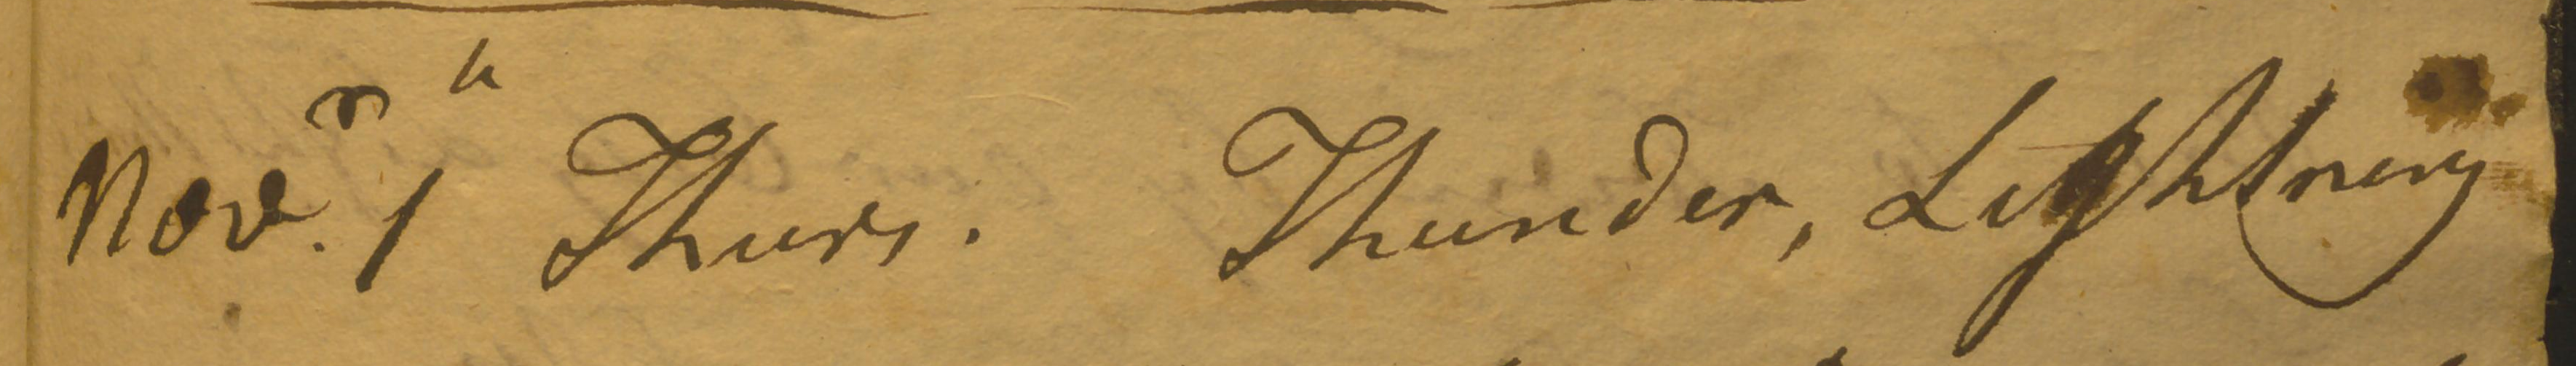Nov^r. 1^h Thurs. Thunder, Lightning
